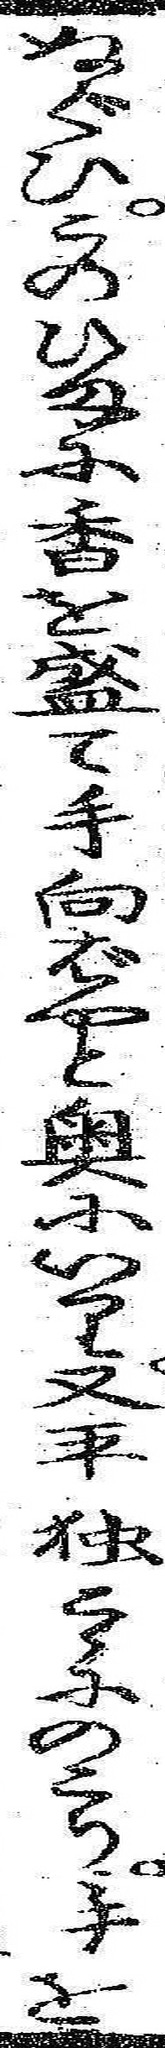ぬぐひ。このひまに香を盛て。手向ばやと奥にいり。又平独こゝにのこり。手を
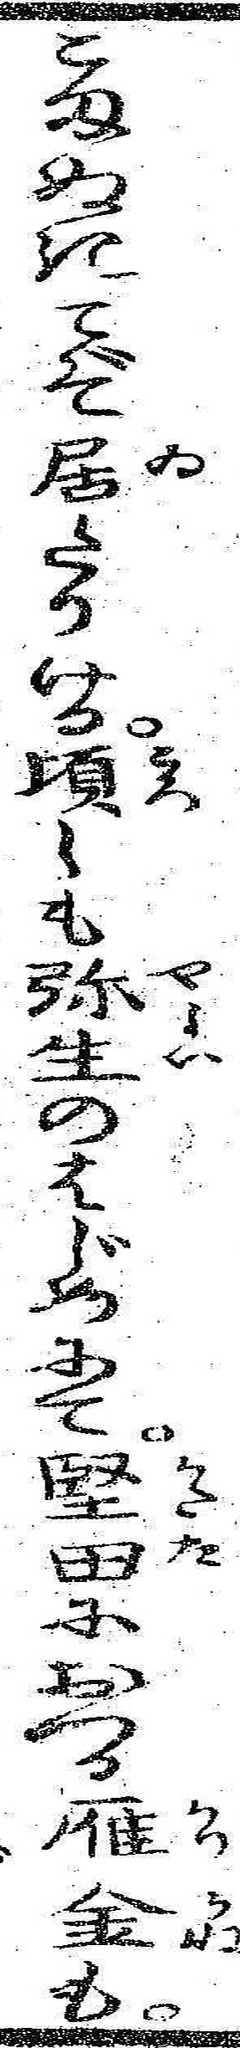こまぬきてぞ居たりける。頃しも弥生のはじめにて。堅田におつる雁金も。
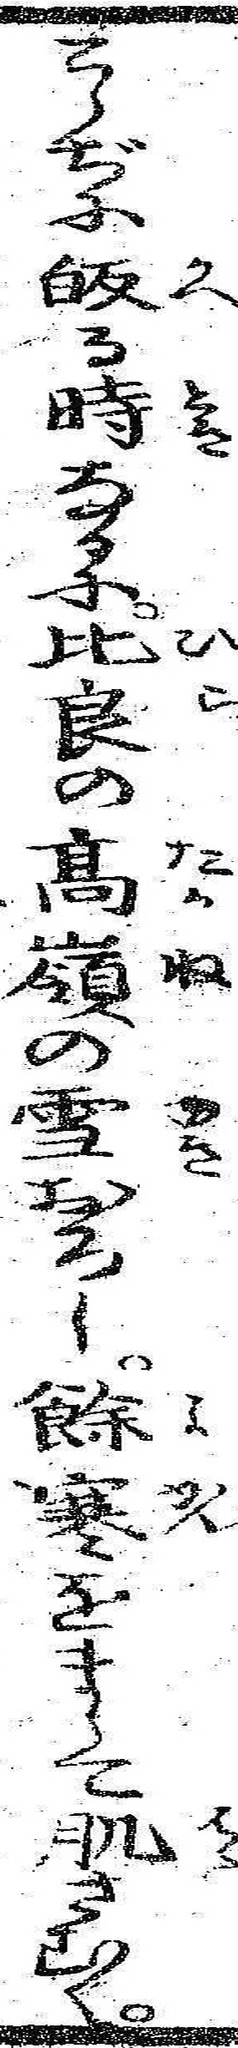こしぢに帰る時なるに。比良の高嶺の雪おろし。余寒をまして肌さむく。
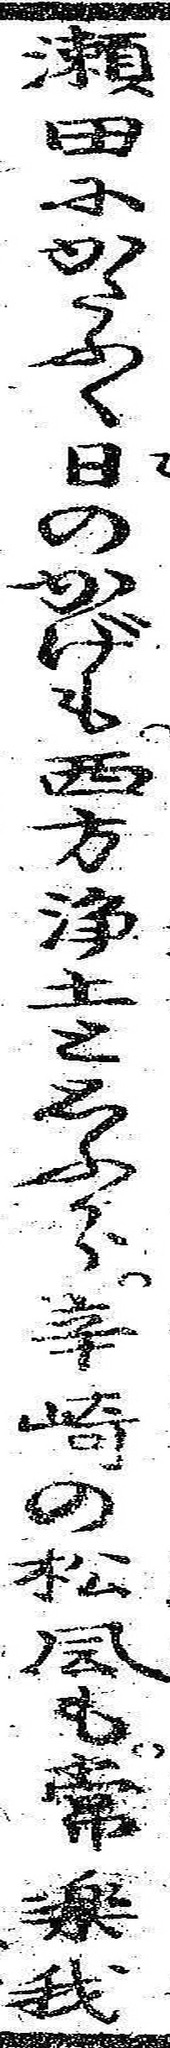瀬田にかたふく日のかげも。西方浄土と思ふから。辛崎の松風も。常楽我
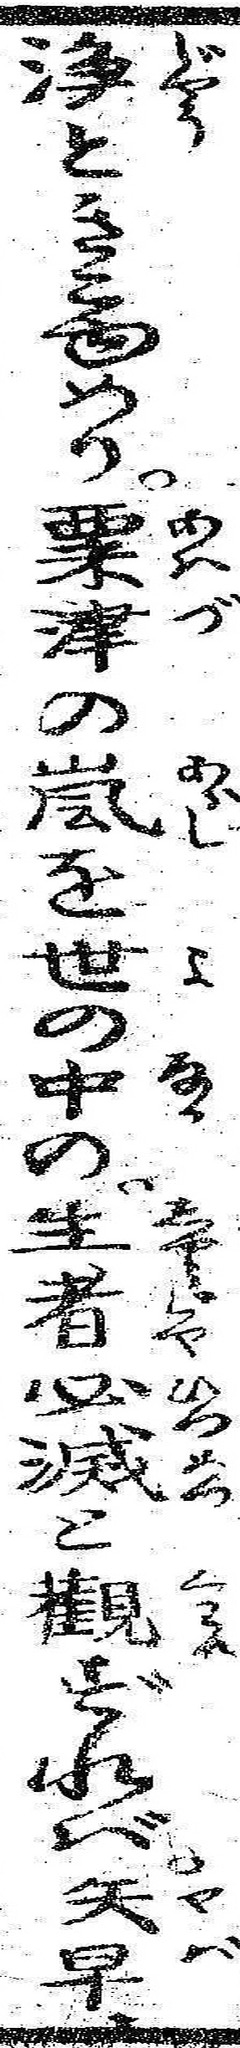浄ときこゆめり。粟津の嵐を世の中の。生者必滅と観ずれば。矢早
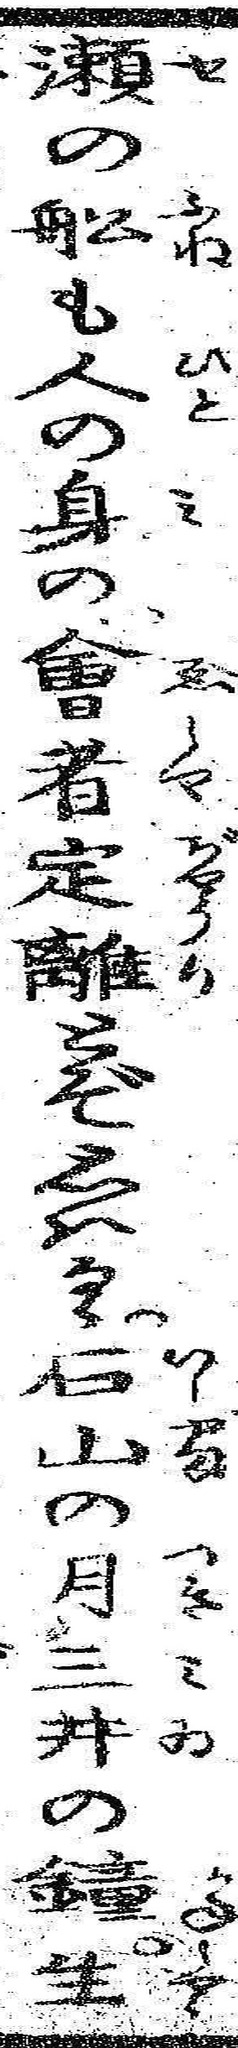瀬の船も人の身の会者定離とぞ思はるゝ。石山の月三井の鐘。生
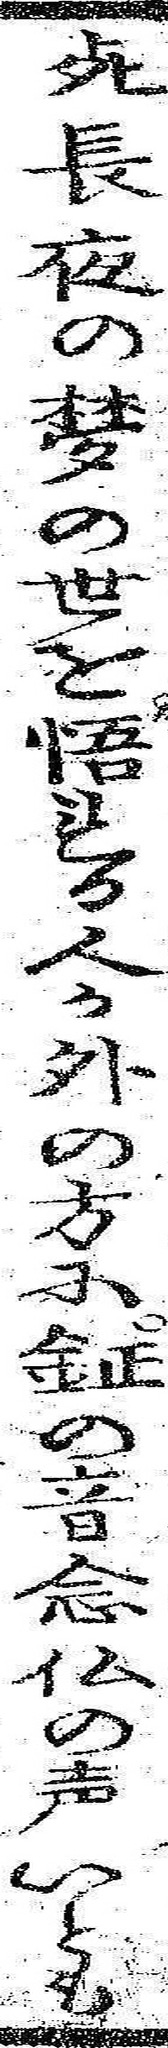死長夜の夢の世を。悟れる人か外の方に。鉦の音念仏の声。いとも

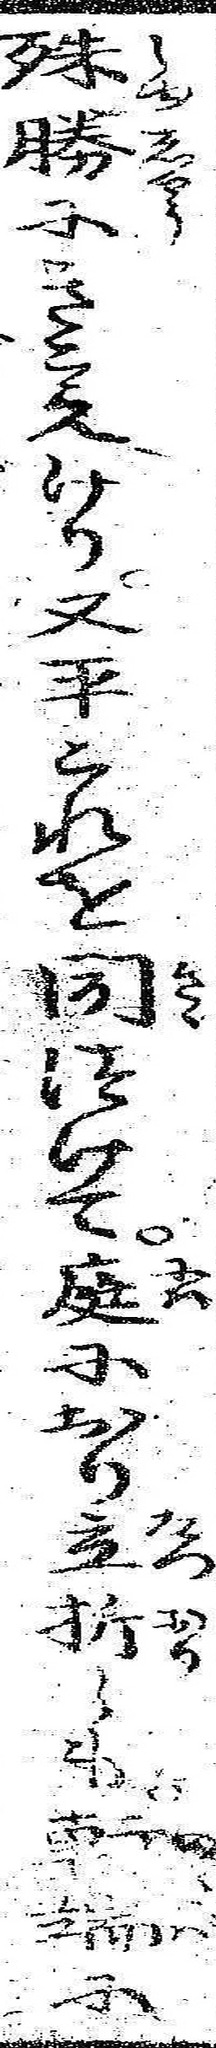殊勝にきこえけり。又平これを聞つけて。庭におり立折しも。軒端に
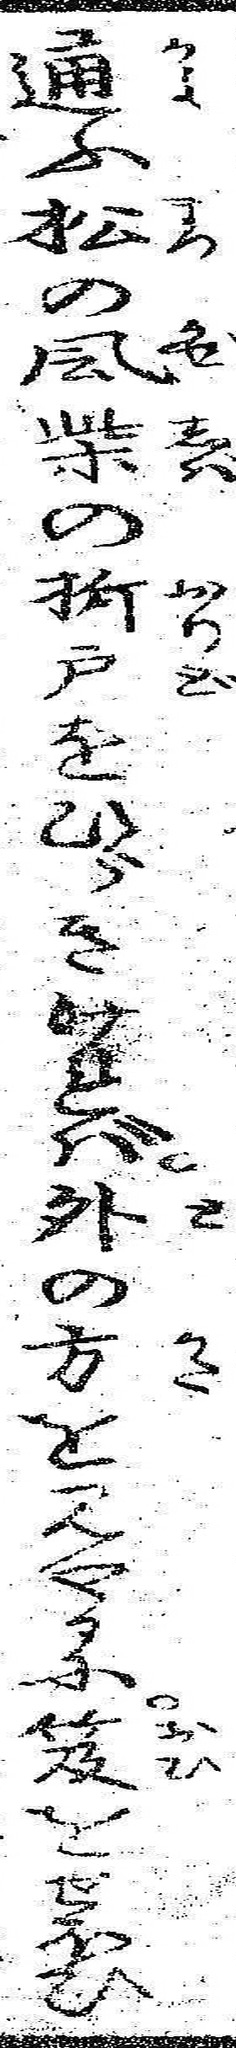通ふ松の風柴の折戸をひらきければ。外の方を見やるに。笈をせほひ
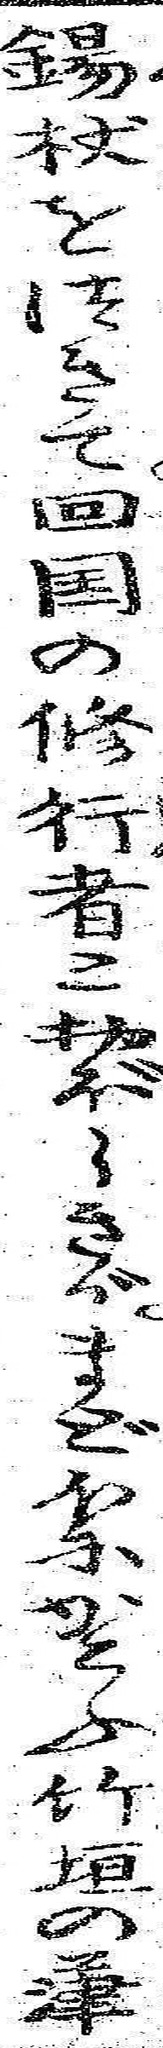錫杖をつきて。回国の修行者とおぼしきが。まどほにかこふ竹垣の葎
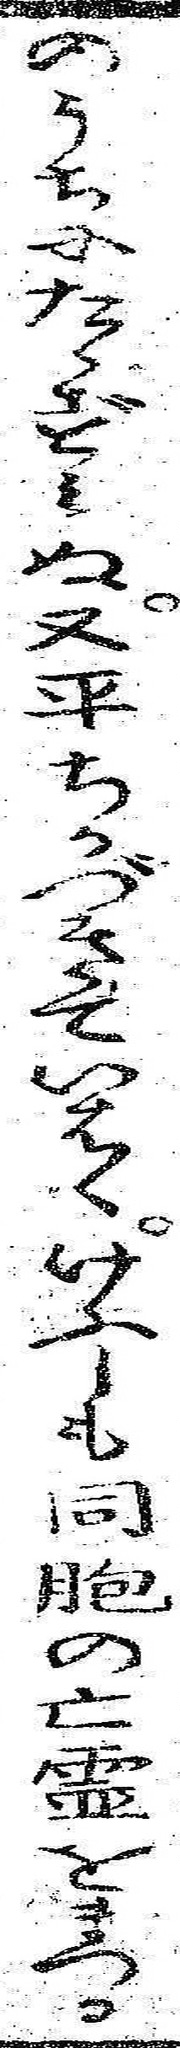のうちにたゝずみぬ。又平ちかづきていはく。けふしも同胞の亡霊をまつる
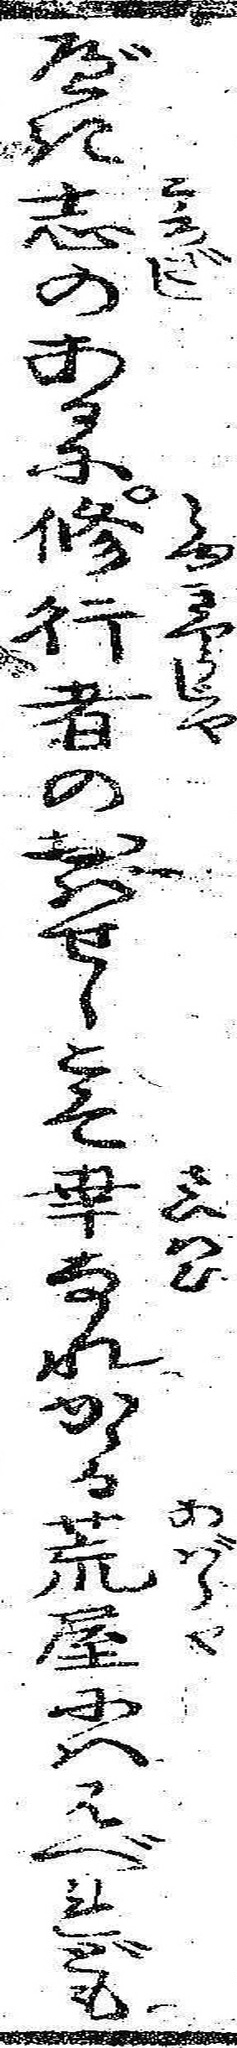べき志のあるに。修行者のおはせしこそ幸なれ。かゝる荒屋にははべれども。
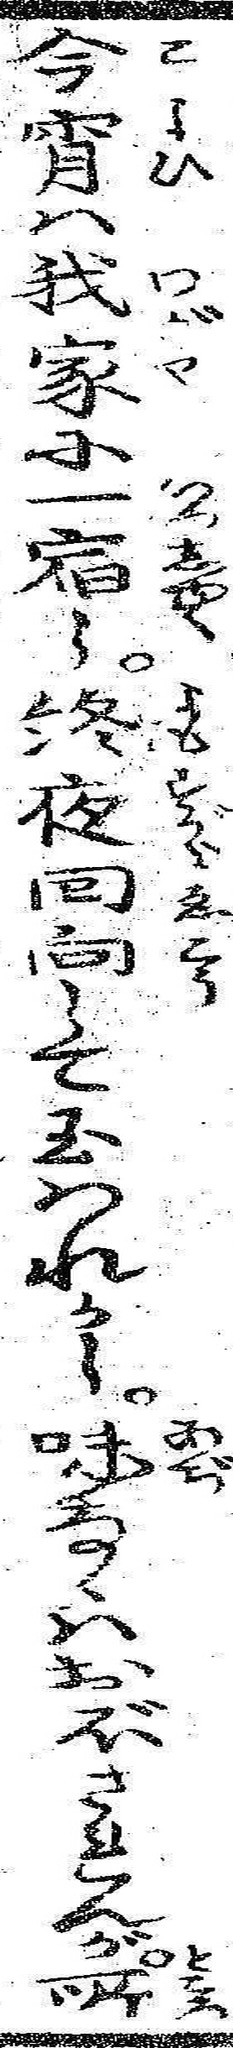今宵は我家に一宿し。終夜回向して玉はれかし。味なくはおぼされんが。所
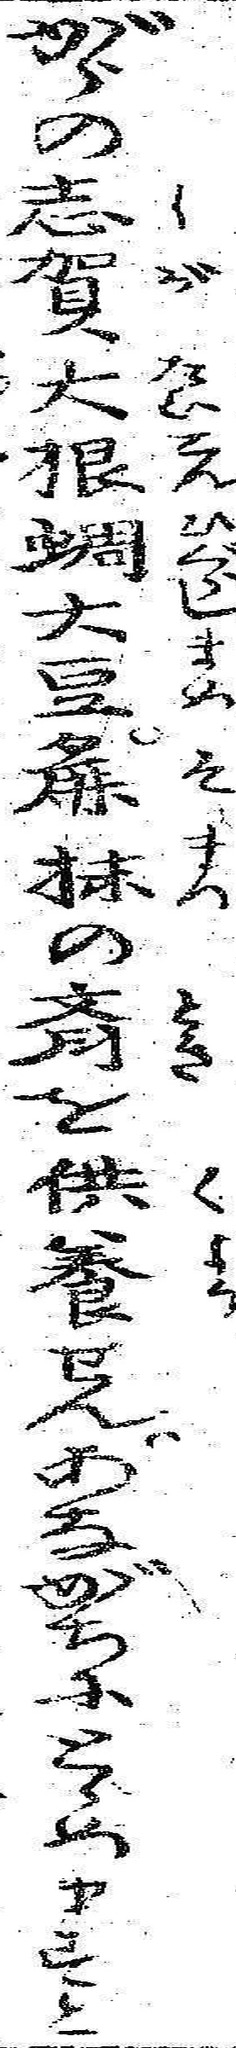がらの志賀大根蜩大豆。麁抹の斉を供養せん。あながちにとゝめ申すと
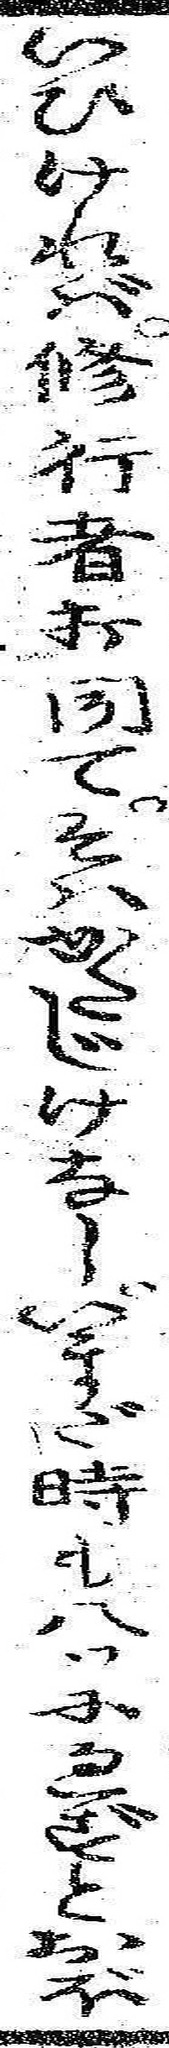いひければ。修行者打聞て。そはかたじけなし。いまだ時も八ツに過ずとおぼ
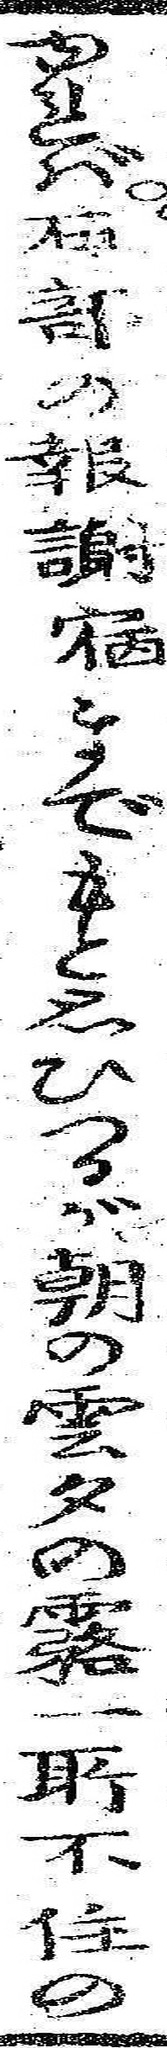ゆれば。石部の報謝宿までもと思ひつるが。朝の雲夕の霧一所不住の
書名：昔話稲妻表紙
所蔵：国文学研究資料館
